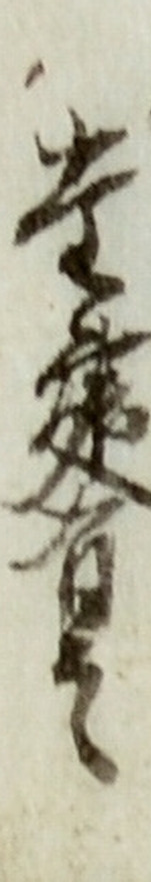宮建有之

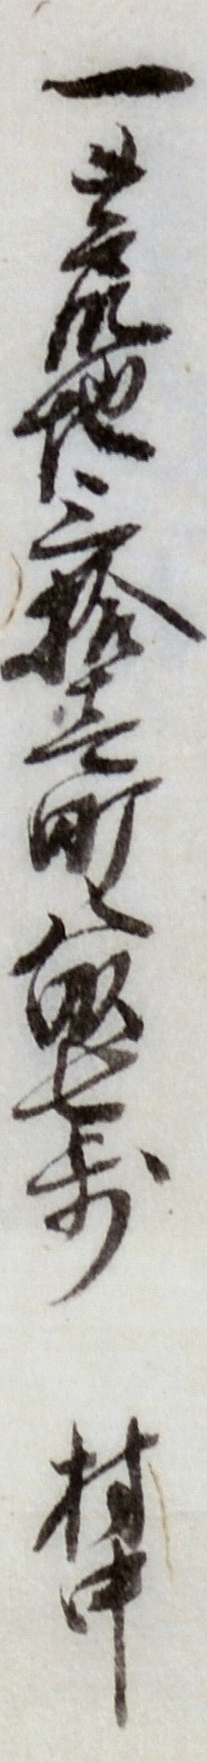一荒地三拾壱町八畝七歩村中
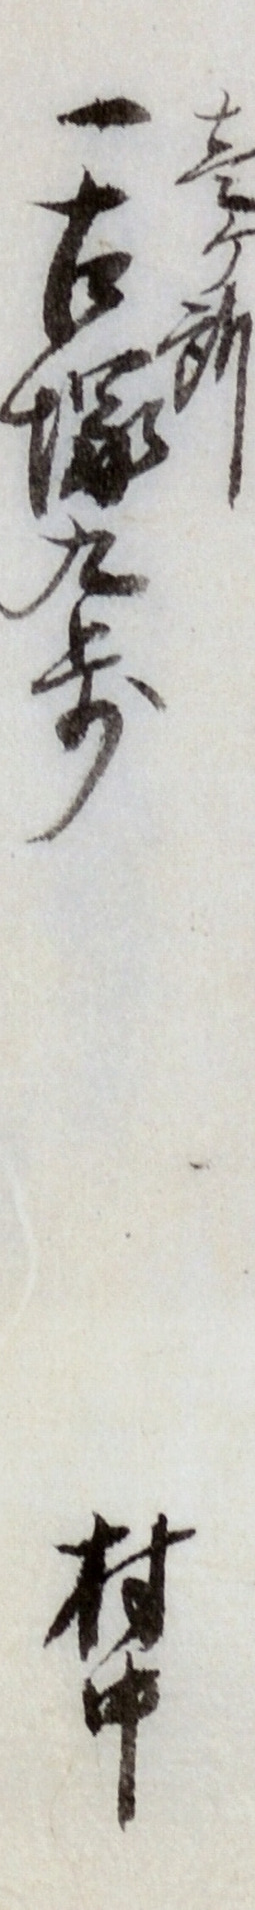一古塚九歩村中
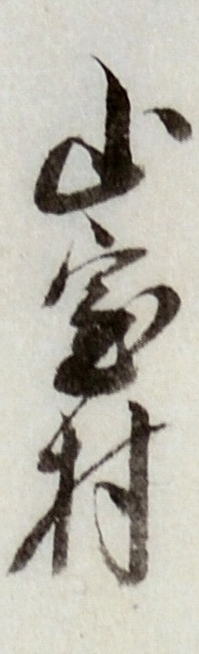山室村
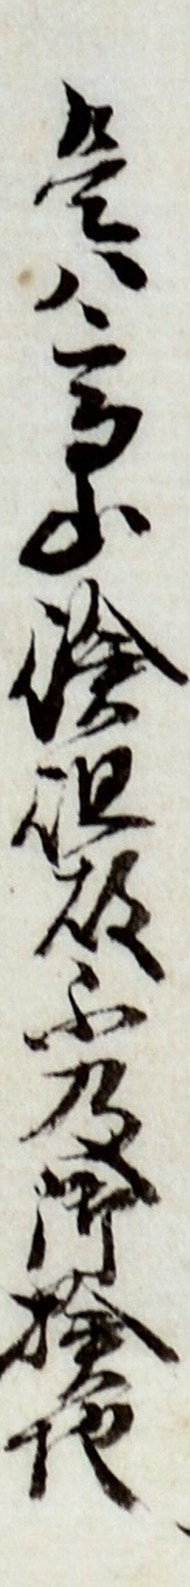是ハ高山嶮岨故不及御検地
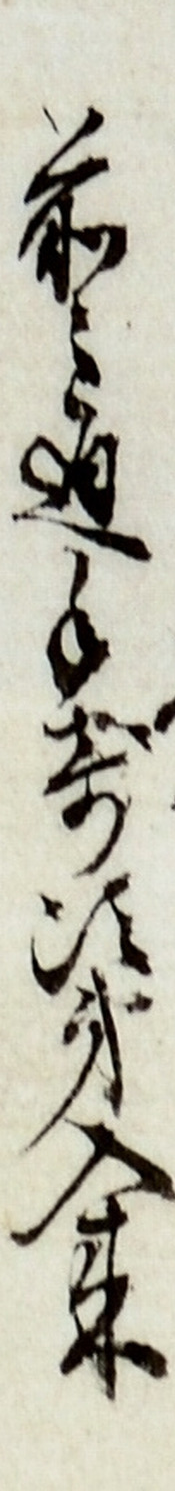前々通手寄次第入来
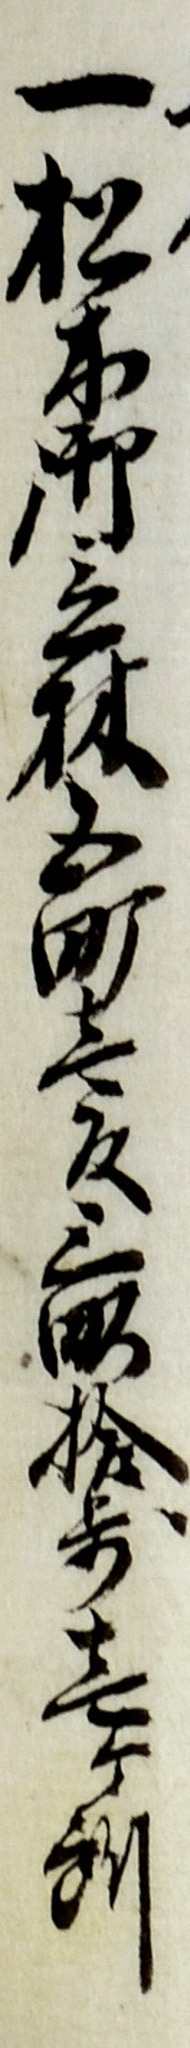一松木御立林五町壱反三畝拾歩壱ヶ所
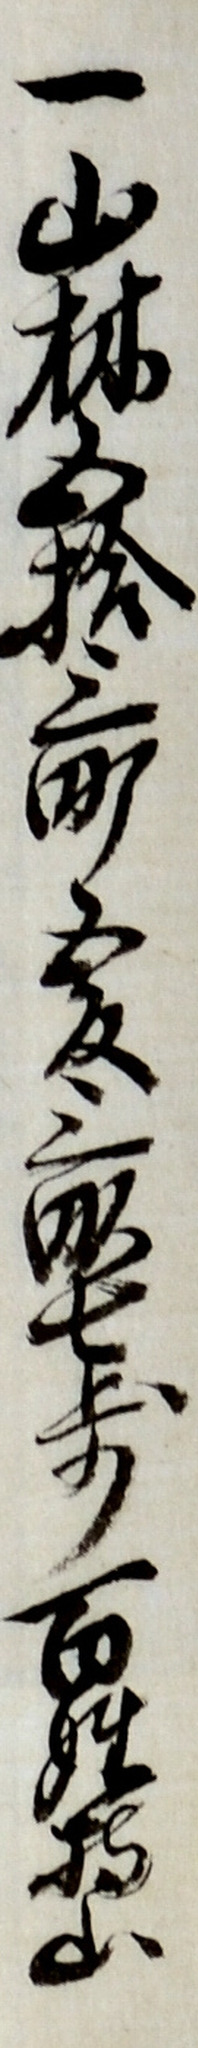一山林五拾三町五反三畝七歩百姓持山
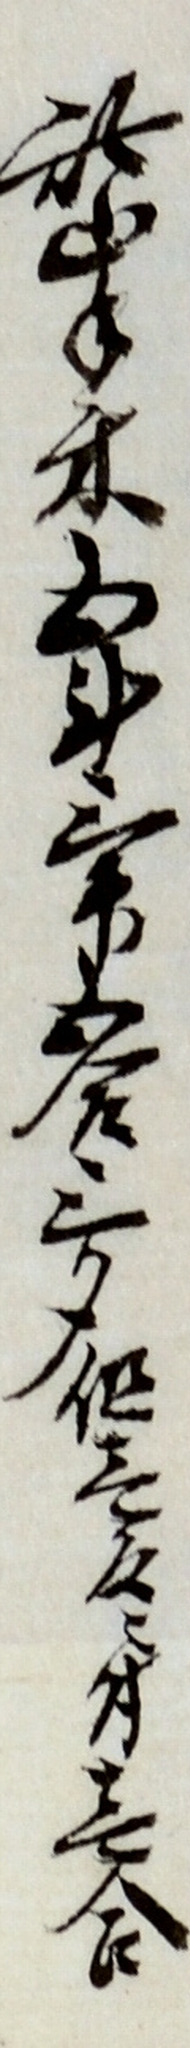此山手米五斗三升五合三勺但壱反ニ付壱合
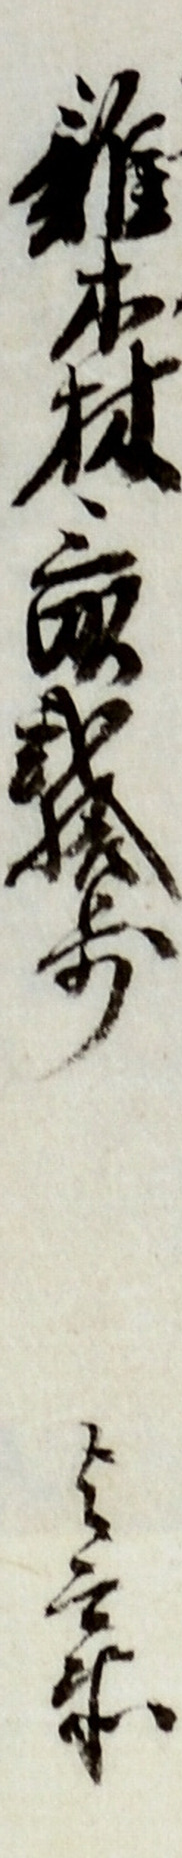雑木林三畝弐拾歩与兵衛
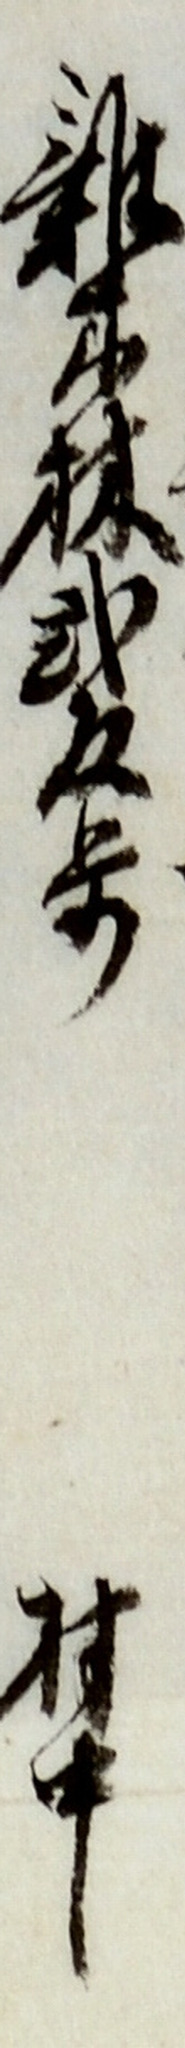雑木林弐反歩村中
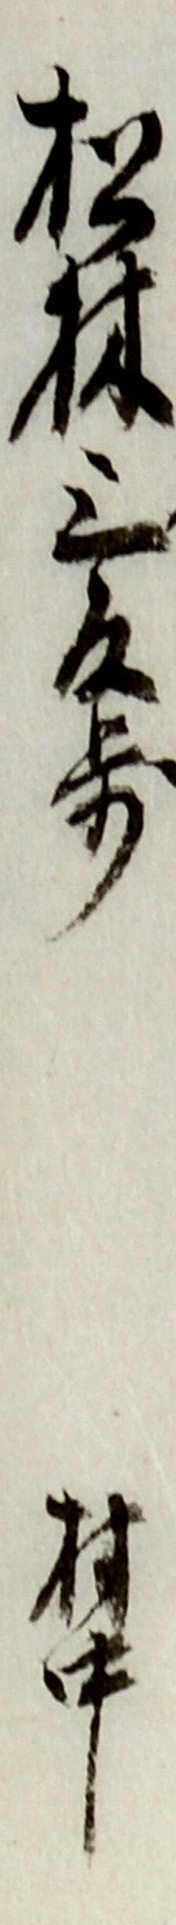松林三反歩村中
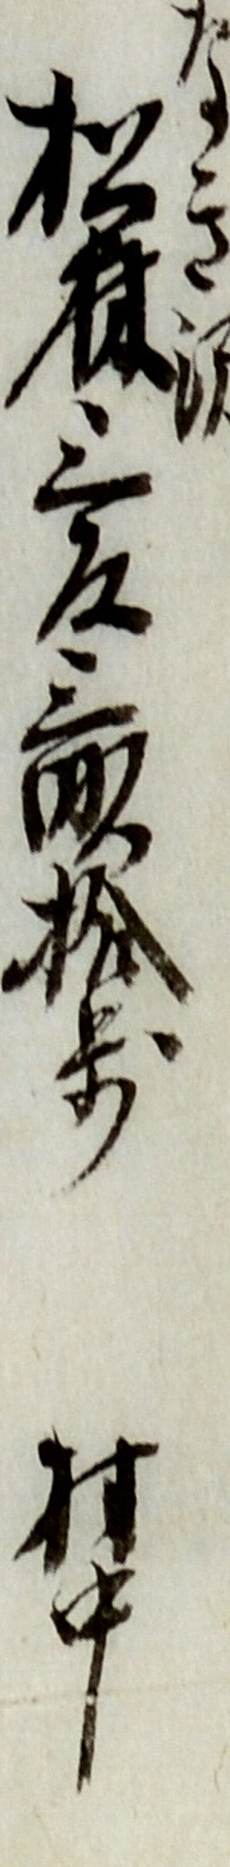松林三反三畝拾歩村中
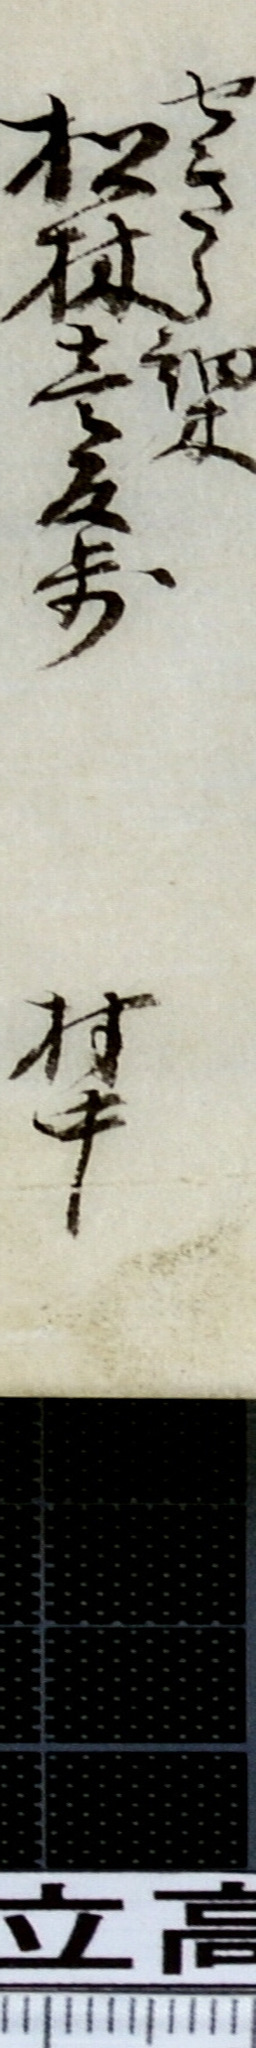松林壱反歩村中
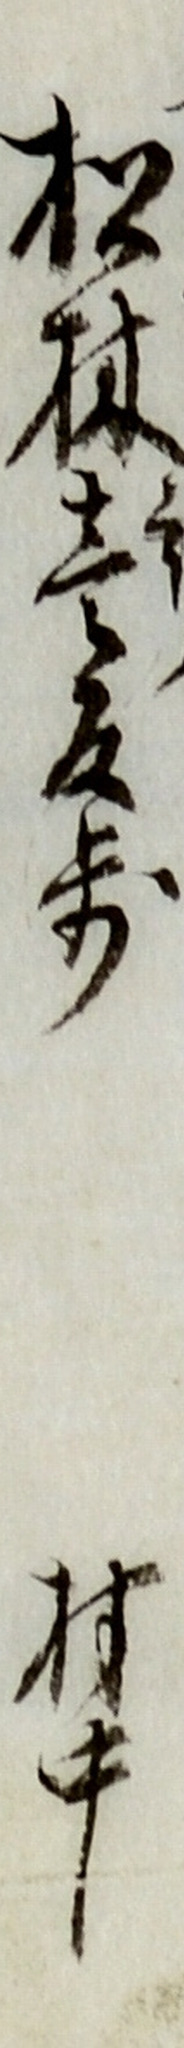松林壱反歩村中
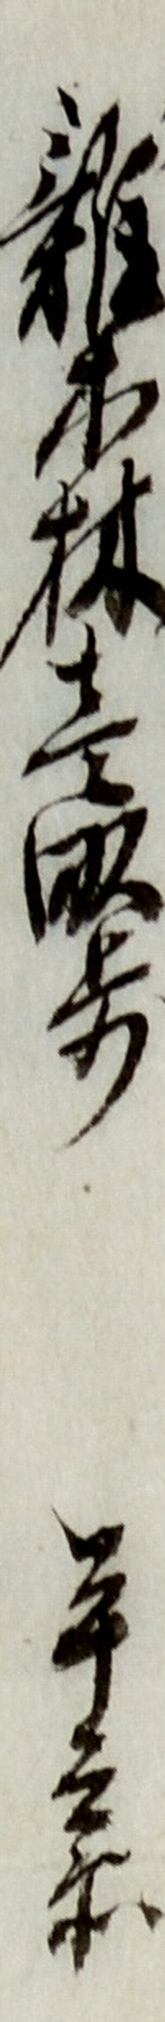雑木林壱畝歩平兵衛
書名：御領分中山林社地手控
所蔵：伊那市立高遠町図書館・合同会社AMANE
